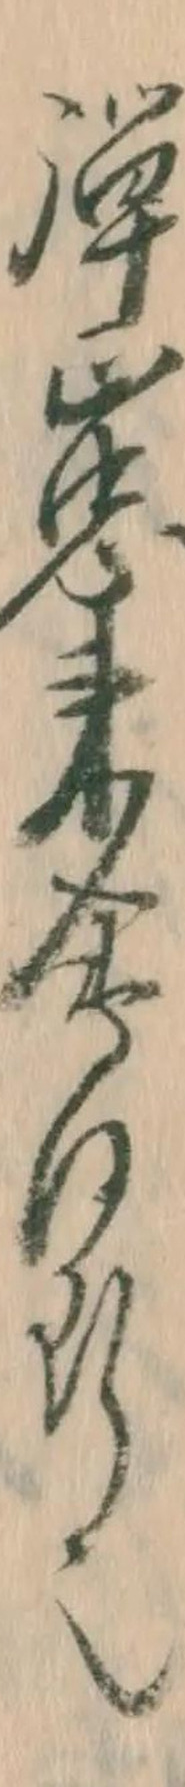弾正忠来會同断也
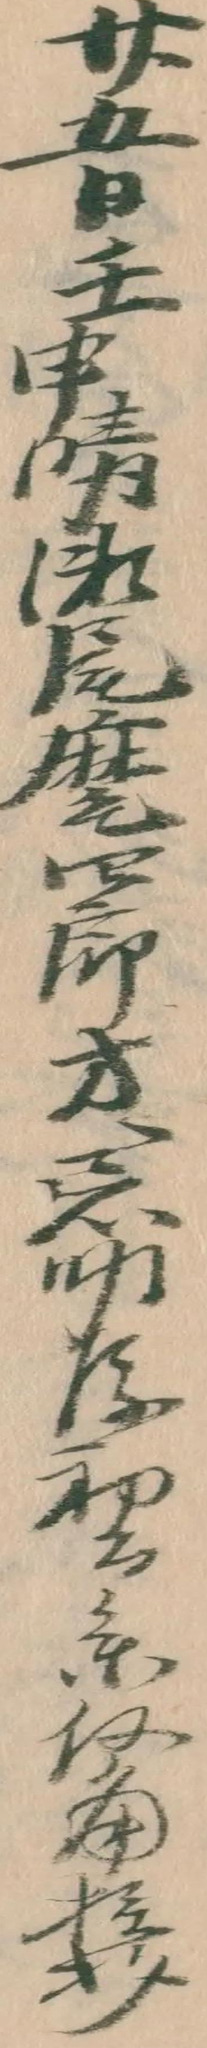廿五日壬申晴瀬尾麾四郎方へ忌明後初而京何角挨拶
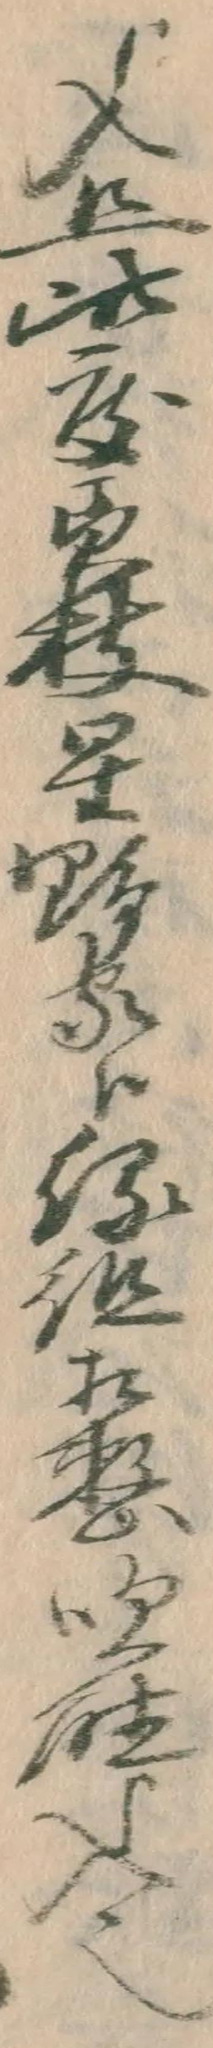申入且此度美枝星野家え縁組相整吹聴申入也
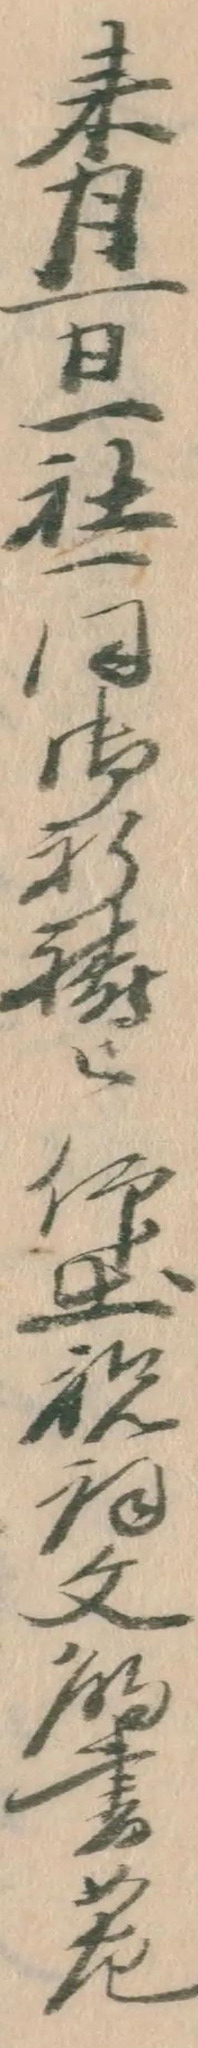来月一日一社一同御祈祷被仰出祝詞文觸書如左
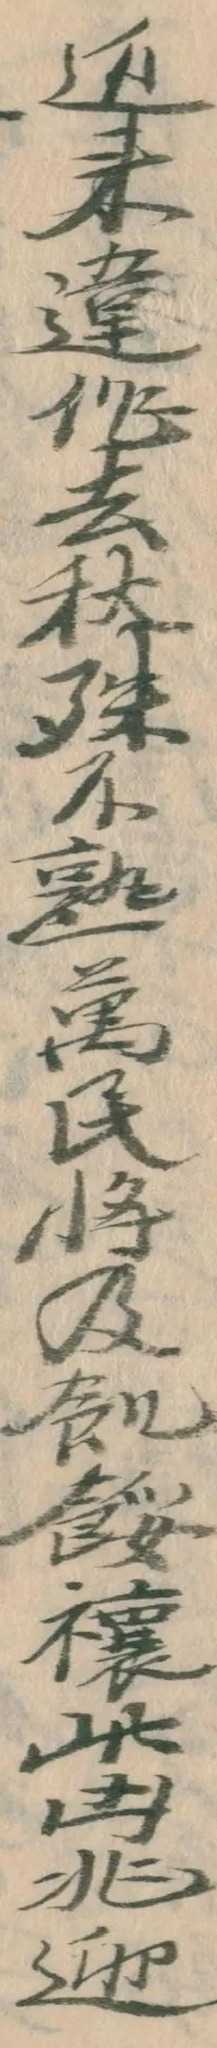近来違作去秋殊不熟萬民将及飢餒穰此凶兆迎
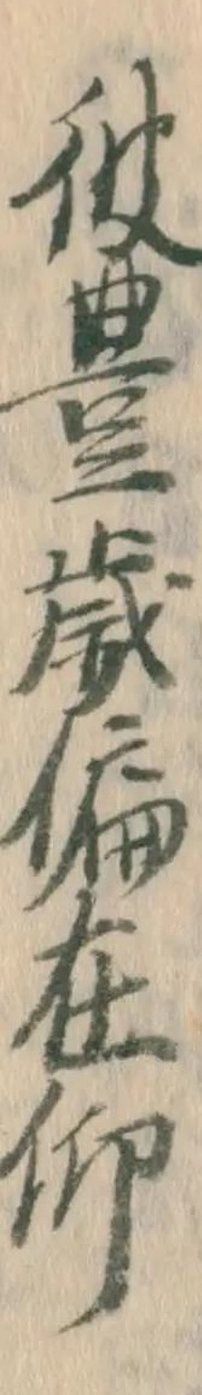彼豊歳偏在仰
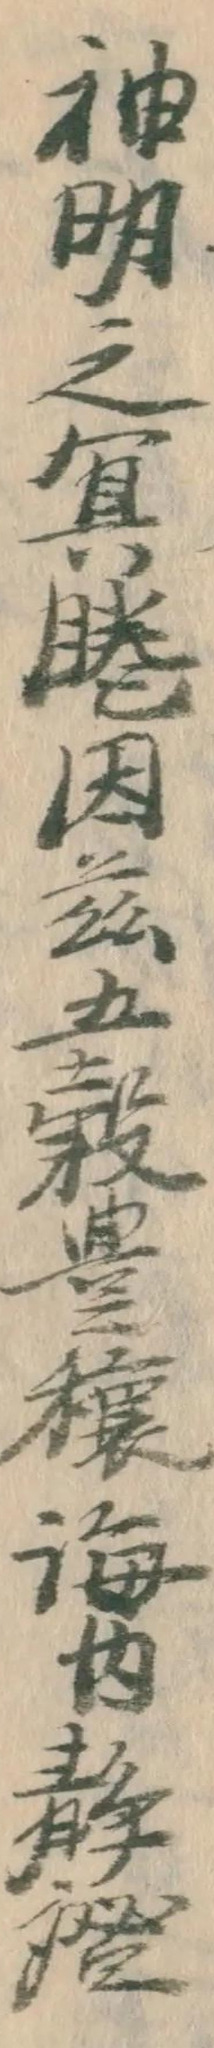神明之冥睠因茲五穀豊穣海内静謐
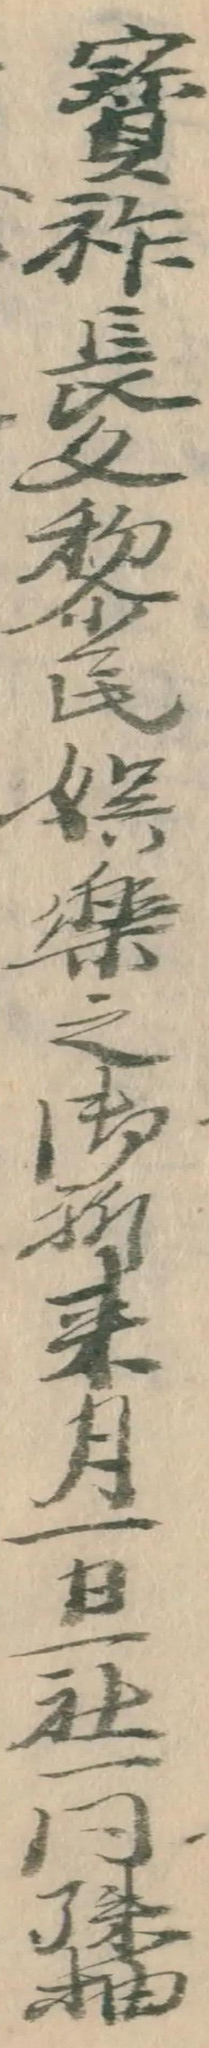寶祚長久しい黎民娯楽之御祈来月一日一社一同殊抽
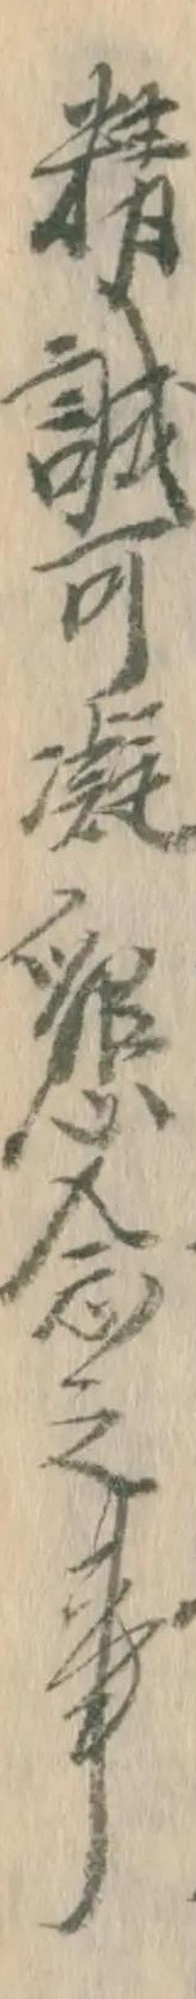精誠可凝懇念之事

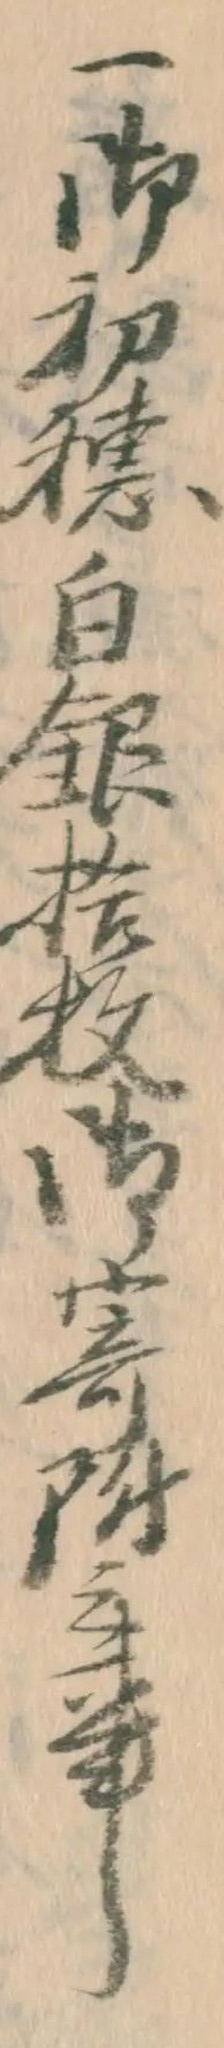一御初穂白銀拾枚御寄附之事
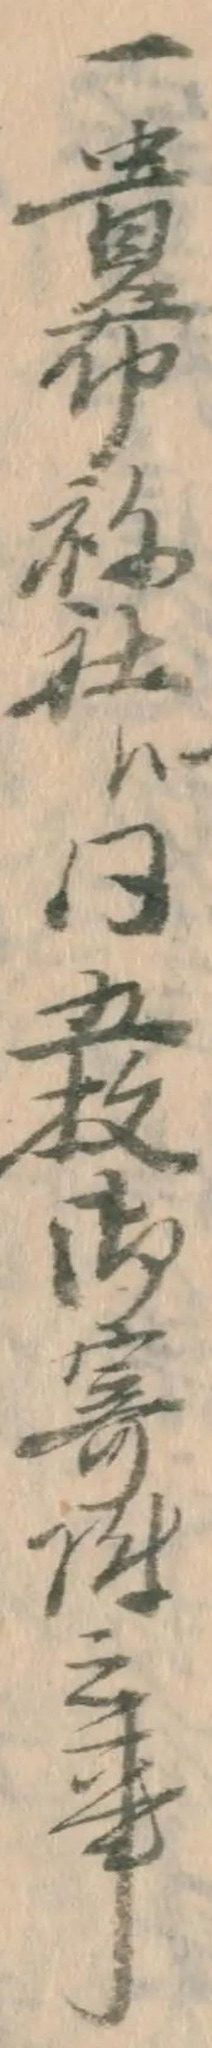一貴布祢社え同五枚御寄附之事
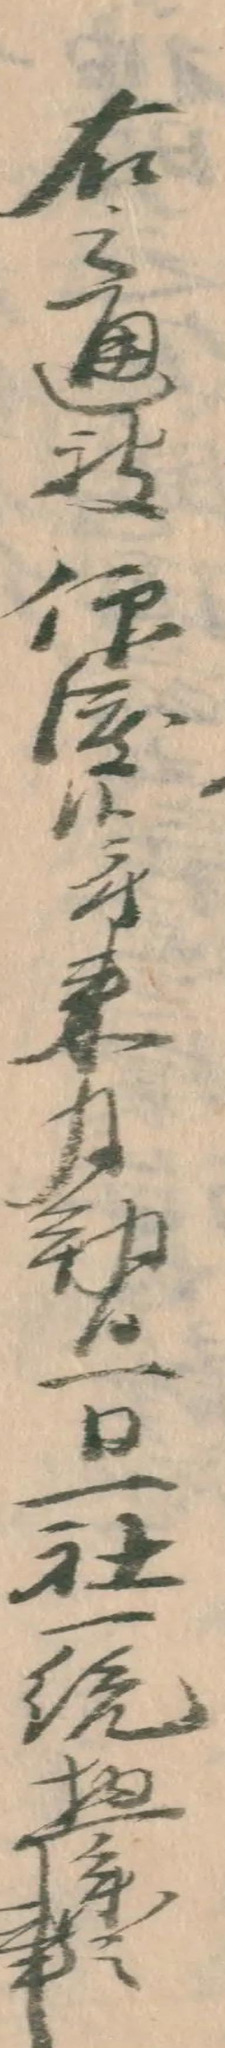右之通被仰渡候に付来月朔日一日一社一統惣参之事
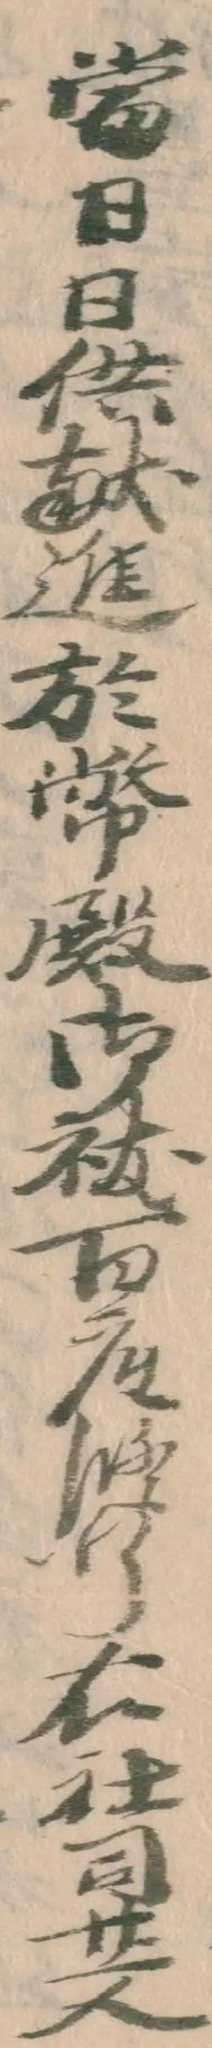一當日日供献進於幣殿御祓百座修行右社司廿一人
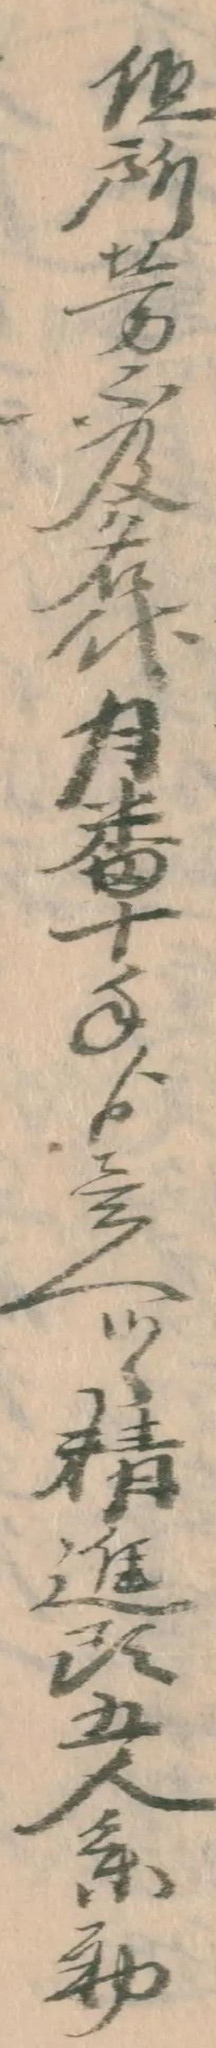但所労不及名代月番十手ゟ壱人ツヽ精進頭五人参勤
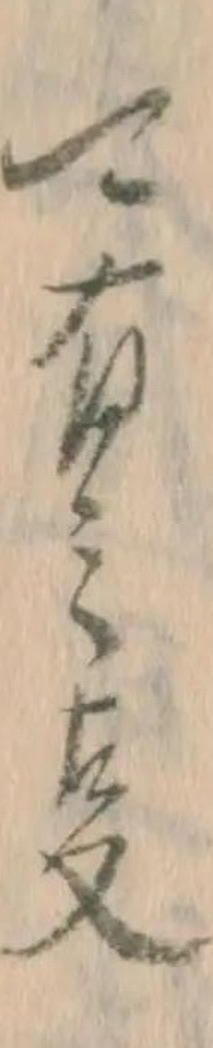可有之事
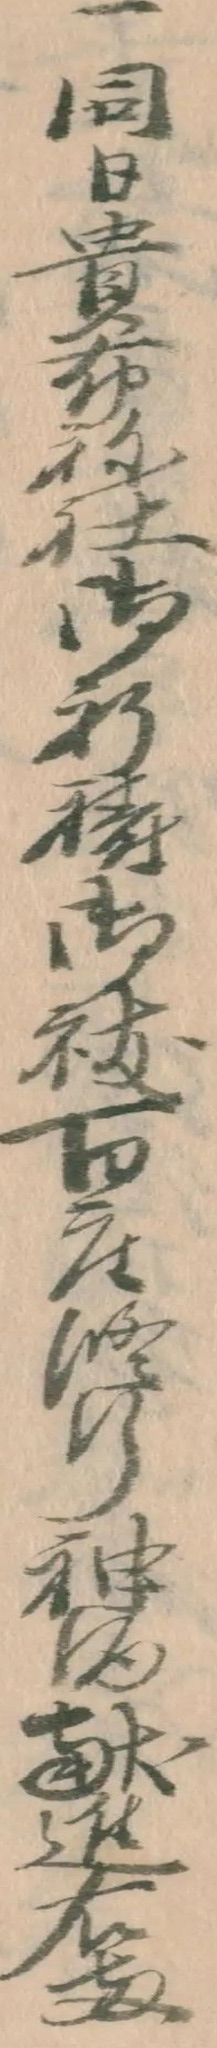一同日貴布祢社御祈祷御祓百座修行神酒献進右両
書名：賀茂社記録. 第67冊
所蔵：国立国会図書館 National Diet Library, JAPAN
